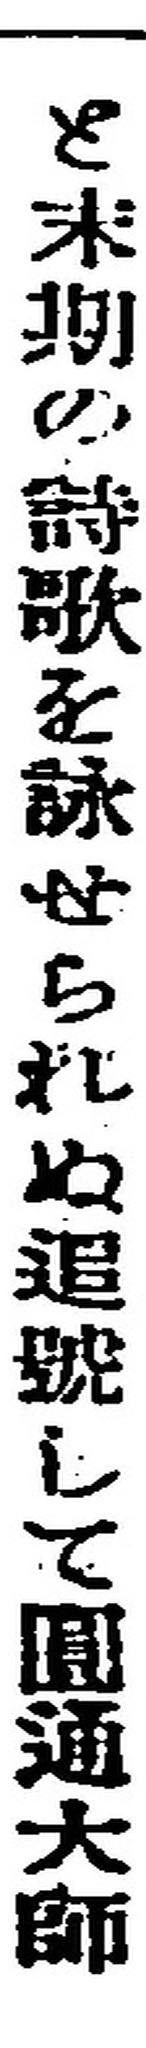と末期の詩歌を詠せられぬ追号して円通大師
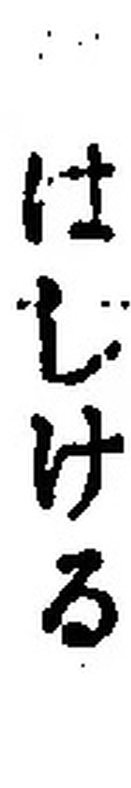はしける
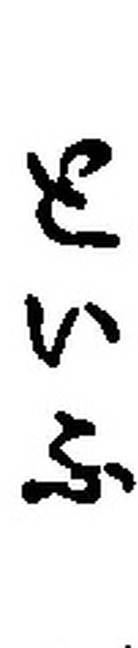といふ
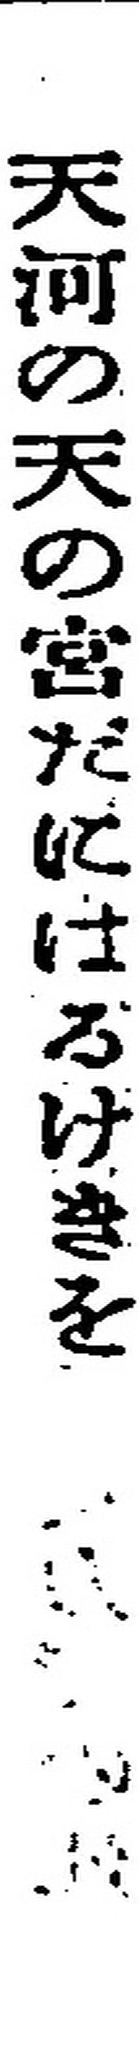天河の天の宮だにはるけきを
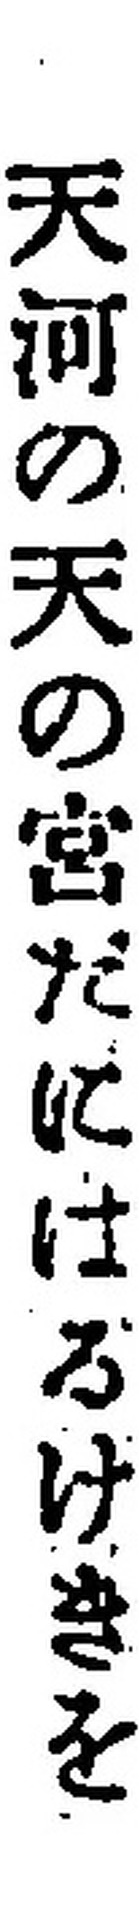天河の天の宮だにはるけきを
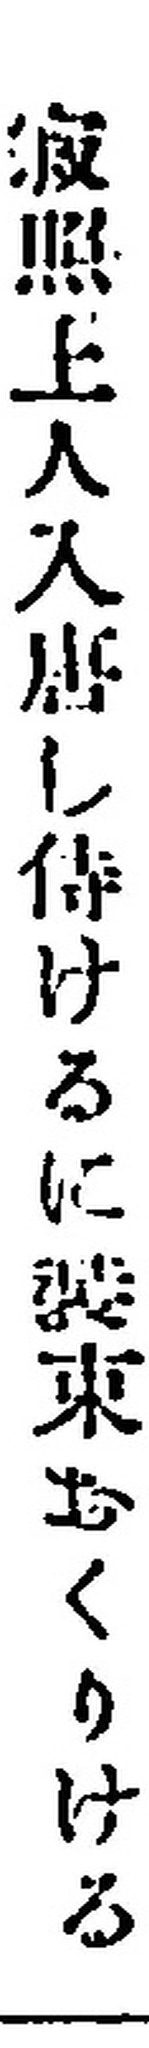寂照上人入唐し侍けるに装束おくりける
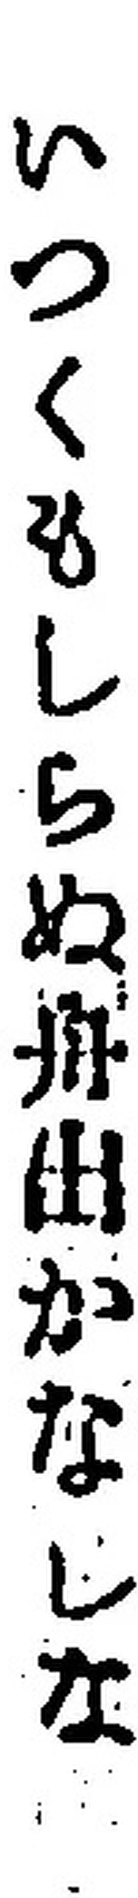いつくもしらぬ舟出かなしな
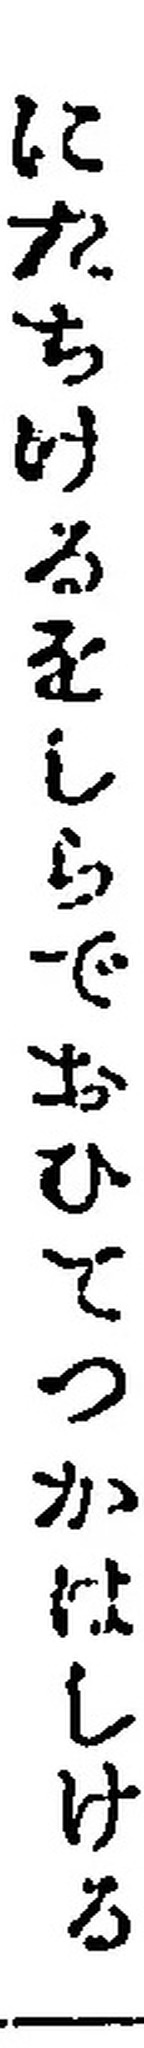にたちけるをしらでおひてつかはしける
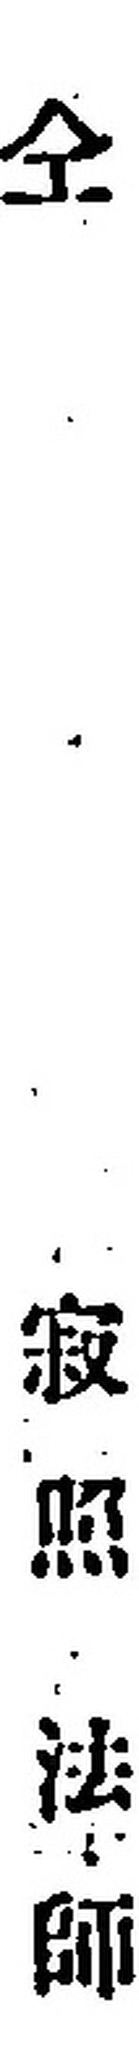仝寂照法師
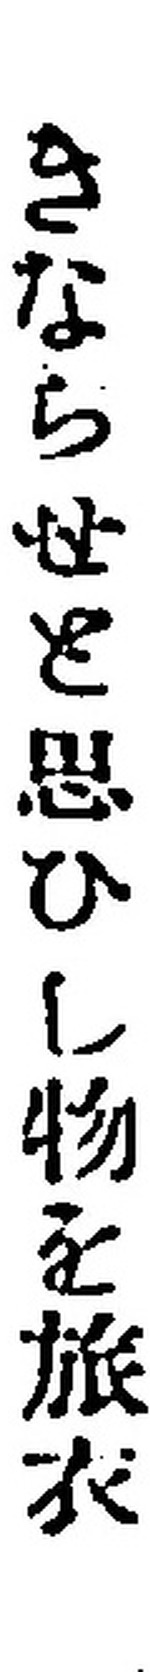きならせと思ひし物を旅衣
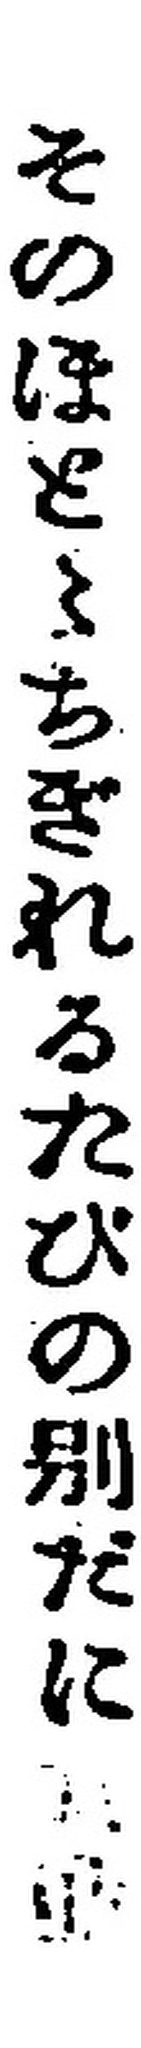そのほとゝちぎれるたびの別だに
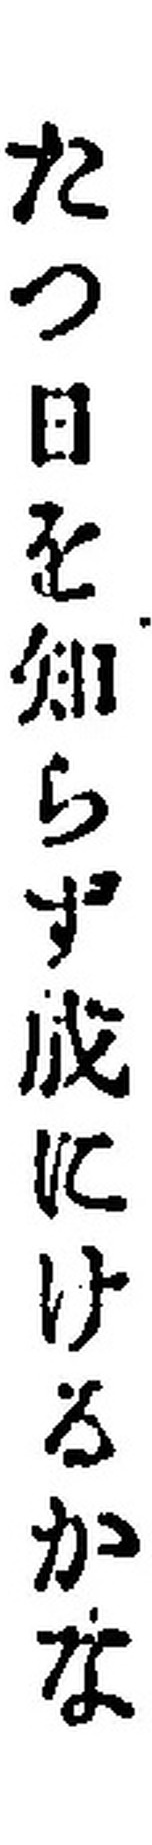たつ日を知らず成にけるかな
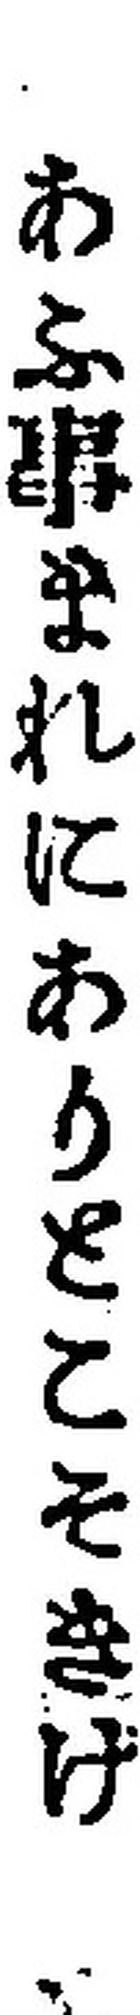あふ事まれにありとこそきけ
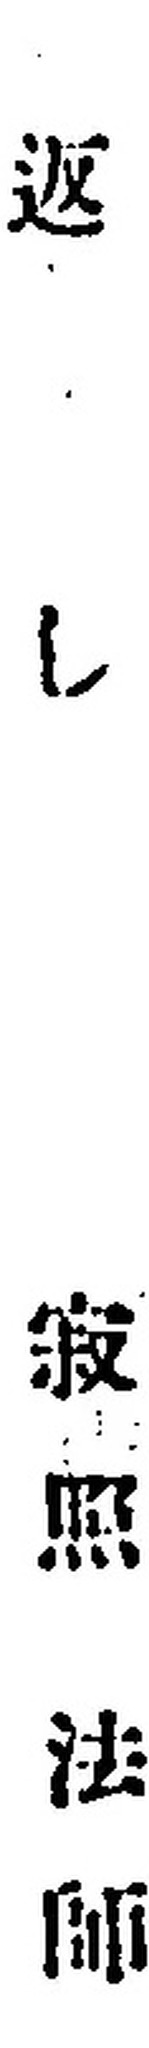返し寂照法師
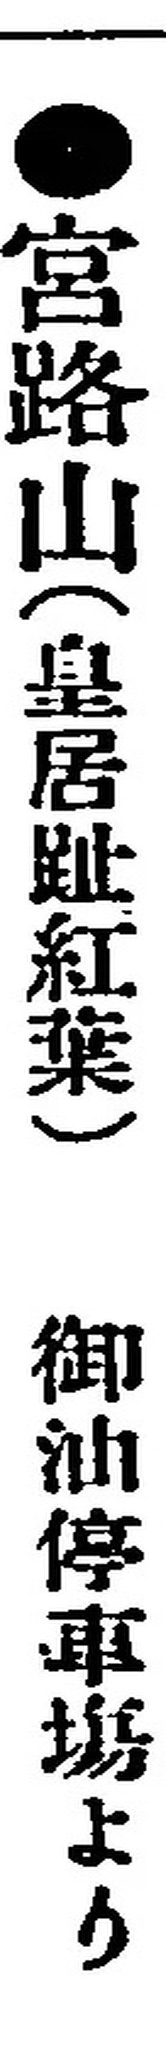●宮路山(皇居趾紅葉)御油停車場より
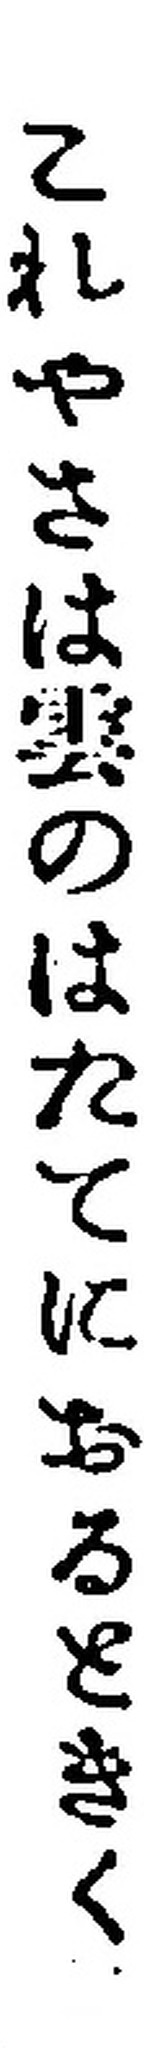これやさは雲のはたてにおるときく
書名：東参名勝案内
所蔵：国立国会図書館 National Diet Library, JAPAN
